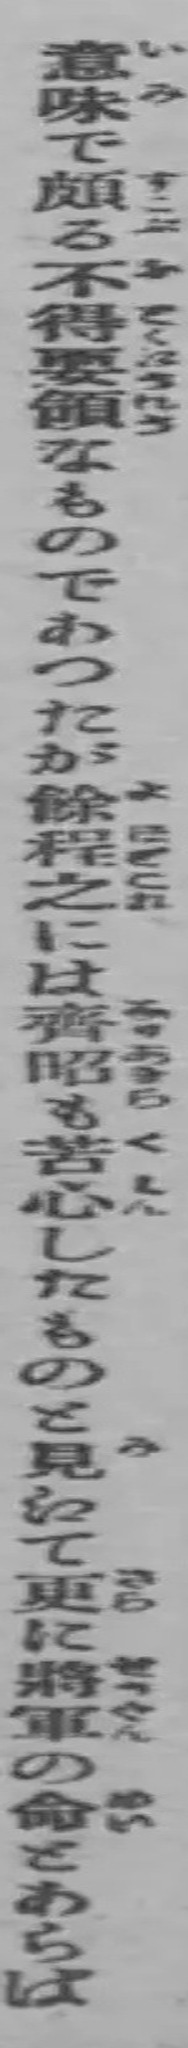意味で頗る不得要領なものであつたが余程之には斉昭も苦心したものと見えて更に将軍の命とあらば
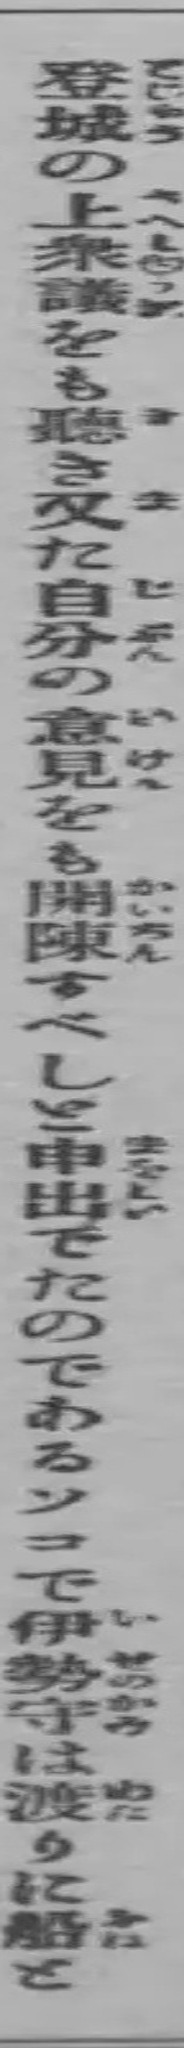登城の上衆議をも聴き又た自分の意見をも開陳すべしと申出でたのであるソコで伊勢守は渡りに船と
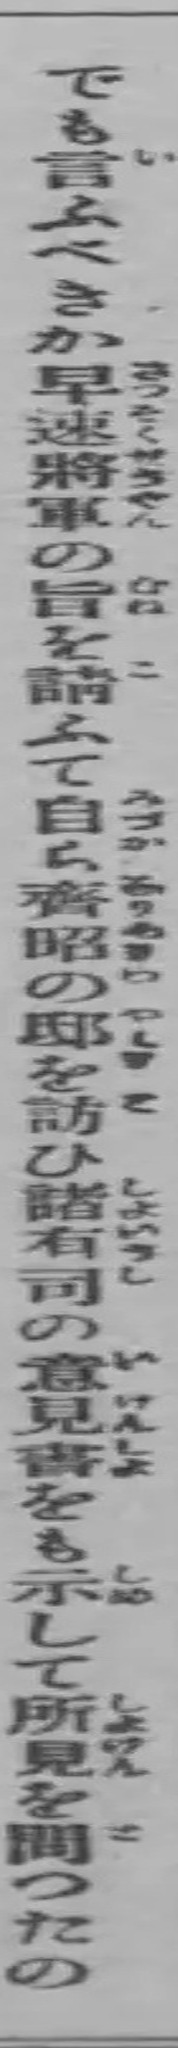でも言ふべきか早速将軍の旨を請ふて自ら斉昭の邸を訪ひ諸有司の意見書をも示して所見を問つたの
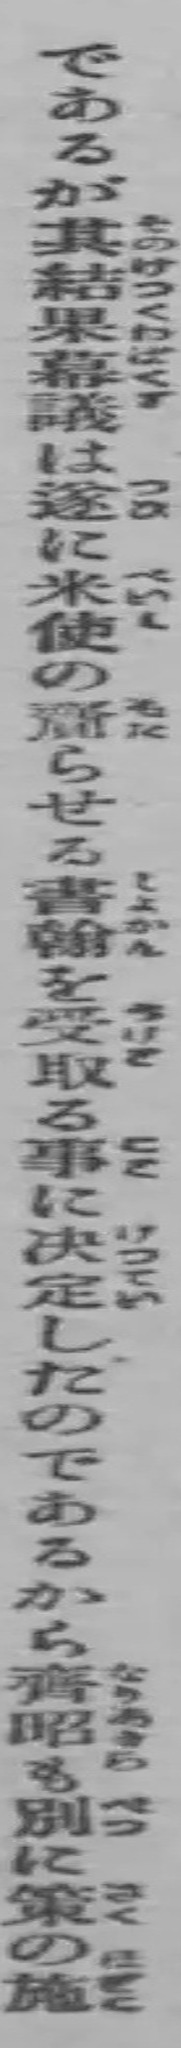であるが其結果幕議は遂に米使の齎らせる書翰を受取る事に決定したのであるから斉昭も別の策の施
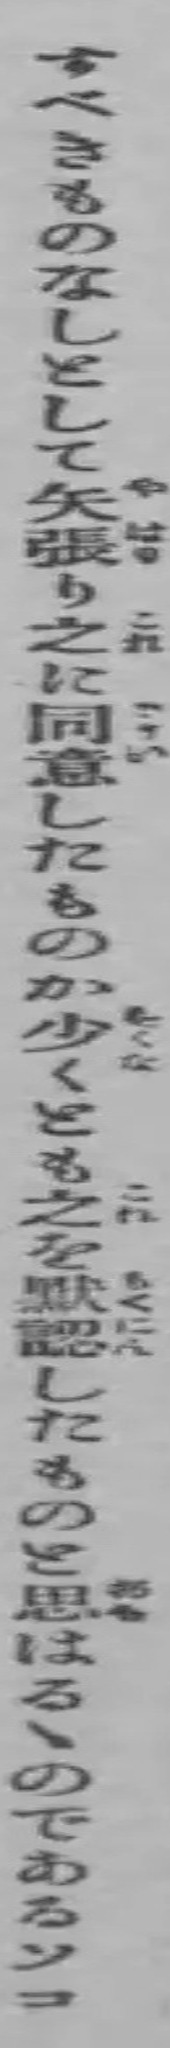すべきものなしとして矢張之に同意したものか少くとも之を黙認したものと思はるゝのであるソコ
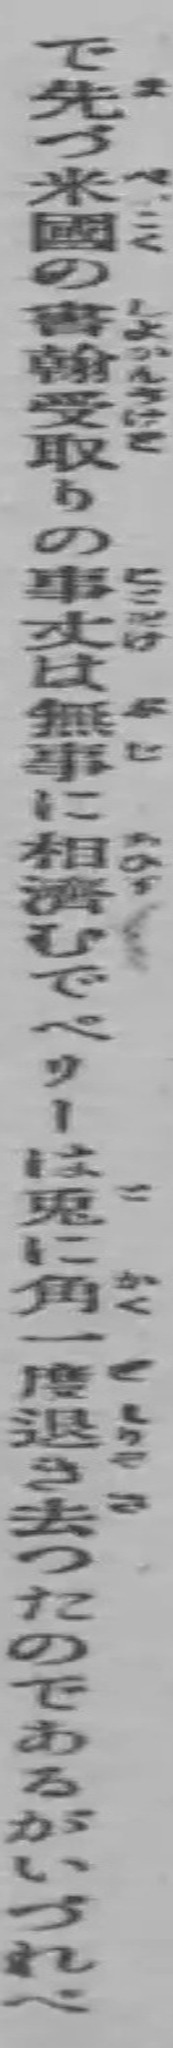で先づ米国の書翰受取りの事丈は無事に相済むでペリーは兎に角一度退き去つたのであるがいづれペ
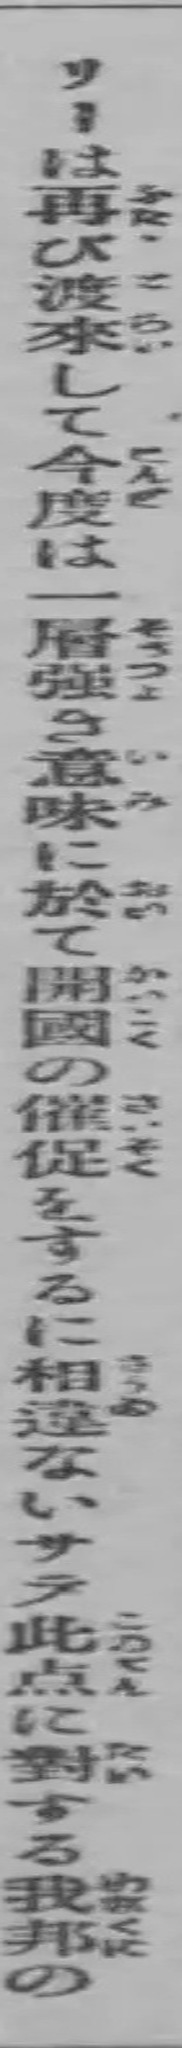リーは再び渡来して今度は一層強き意味に於て開国の催促をするに相違ないサテ此点に対する我邦の
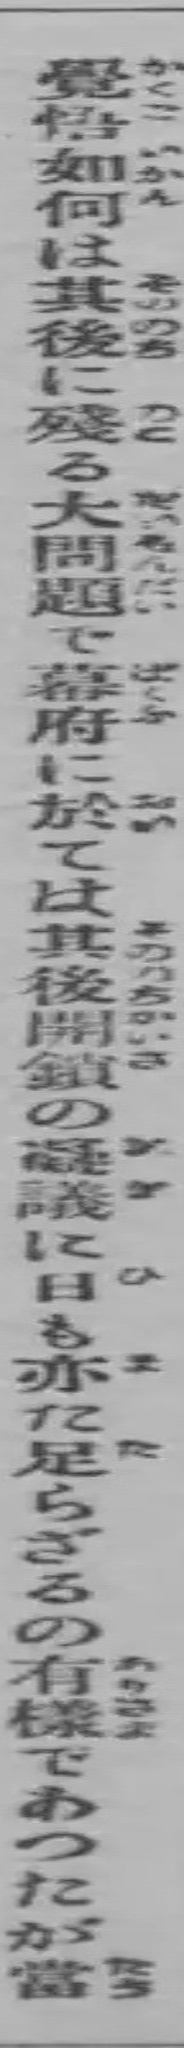覚悟如何は其後に残る大問題で幕府に於ては其後開鎖の疑議に日も亦た足らざるの有様であつたが当
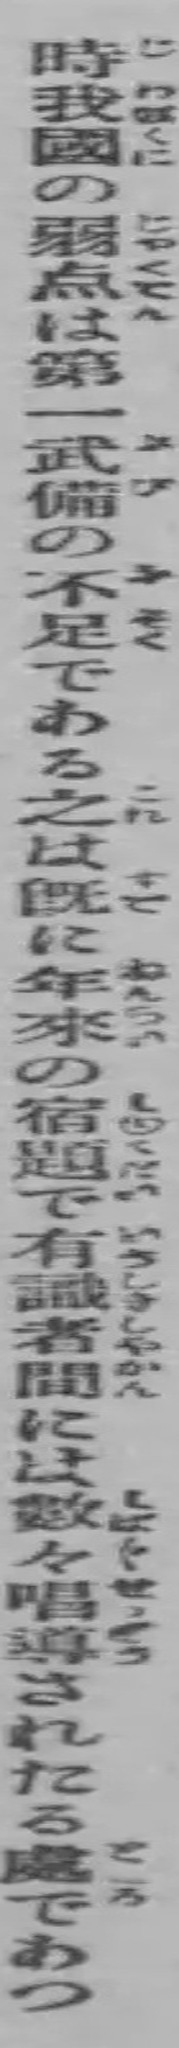時我国の弱点は第一武備の不足である之は既に年来の宿題で有識者間には数々唱導されたる処であつ
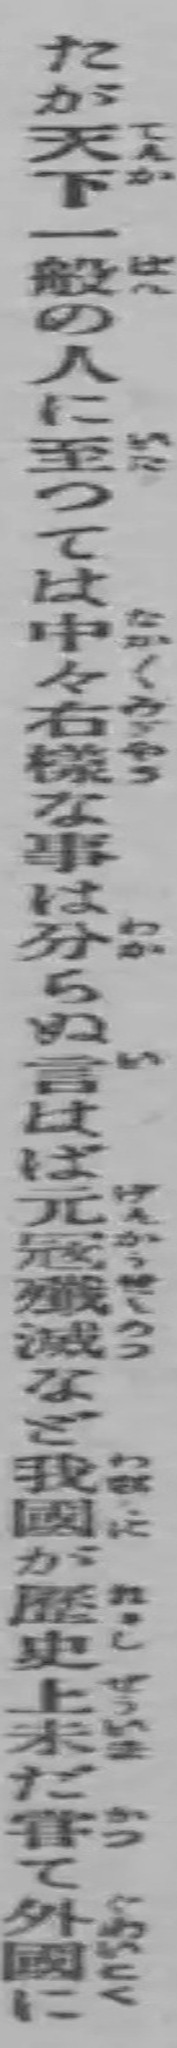たが天下一般の人に至つては中々右様な事は分らぬ言はば元寇殲滅など我国が歴史上未だ嘗て外国に
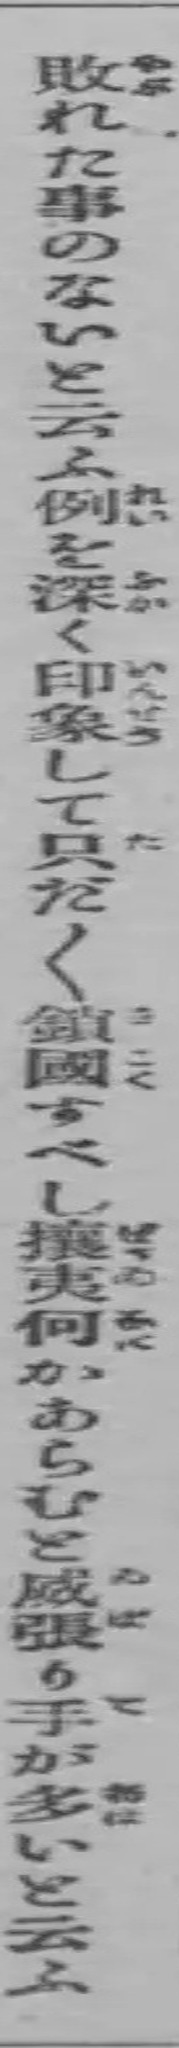敗れた事のないと云ふ例を深く印象して只だ〳〵鎖国すべし攘夷何かあらむと威張り手が多いと云ふ
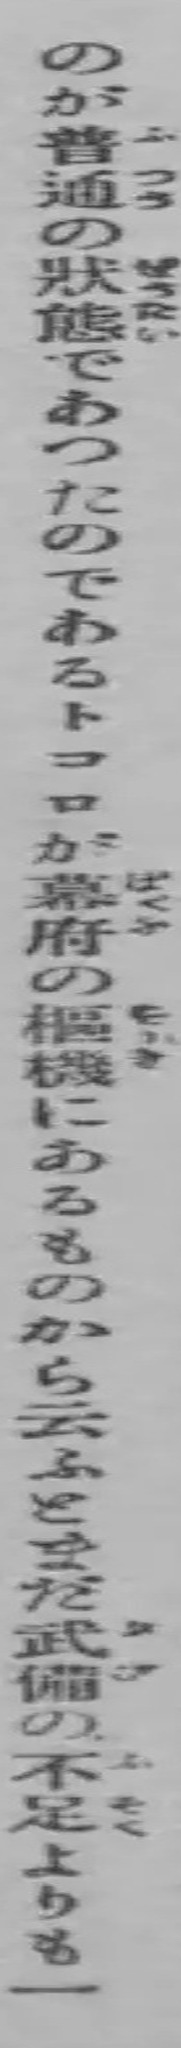のが普通の状態であつたのであるトコロが幕府の枢機にあるものから云ふとまだ武備の不足よりも一
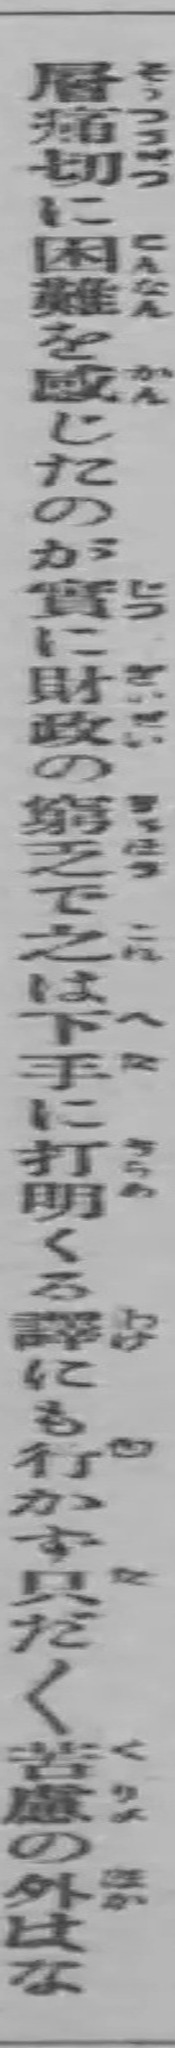層痛切に困難を感じたのが実に財政の窮乏で之は下手に打明くる訳にも行かず只だ〳〵苦慮の外はな
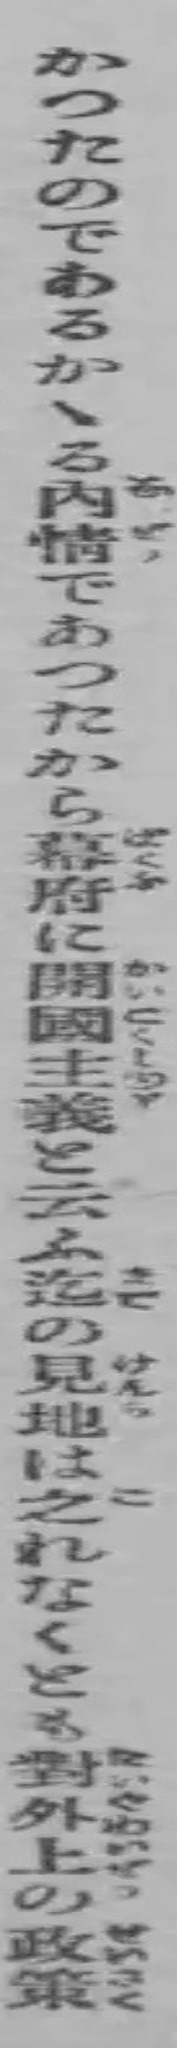かつたのであるかゝる内情であつたから幕府に開国主義と云ふ迄の見地は之れなくとも対外上の政策
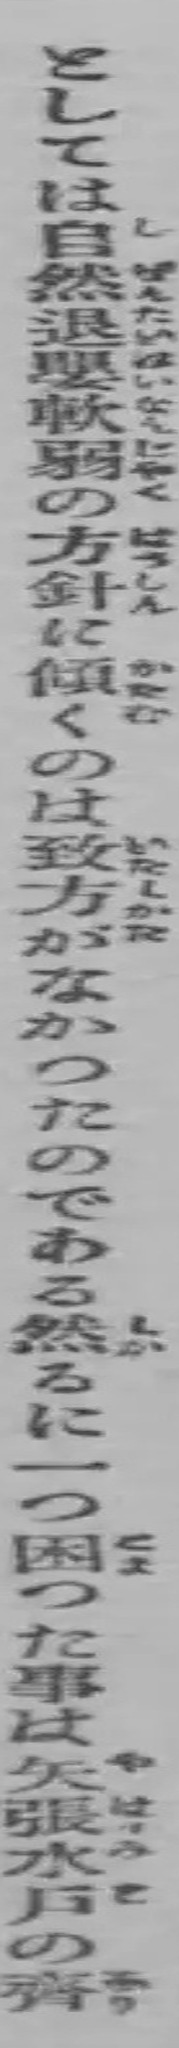としては自然退嬰軟弱の方針に傾くのは致方がなかつたのである然るに一つ困つた事は矢張水戸の斉
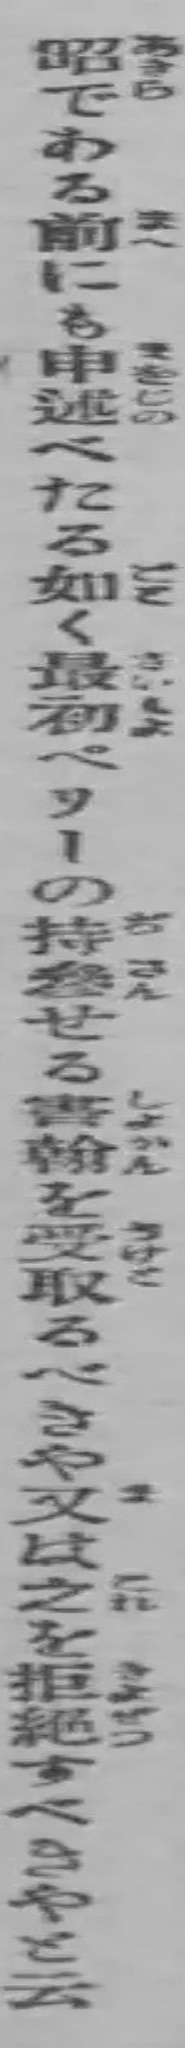昭である前にも申述べたる如く最初ペリーの持参せる書翰を受取るべきや又は之を拒絶すべきやと云
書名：豊橋市史談
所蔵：国立国会図書館 National Diet Library, JAPAN
